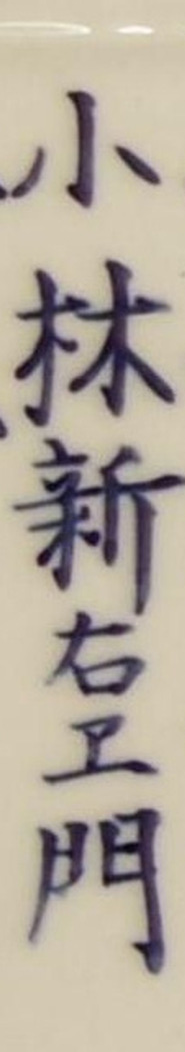小林新右エ門
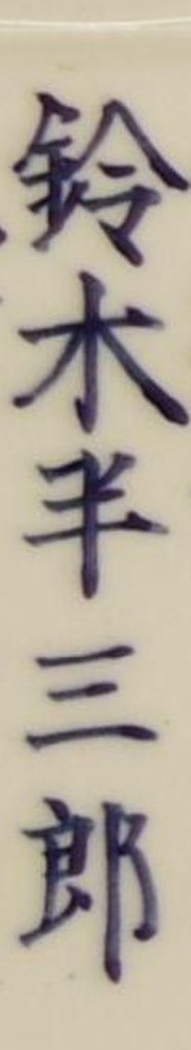鈴木半三郎
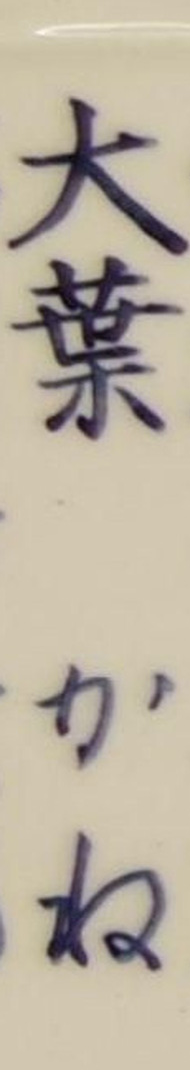大葉かね
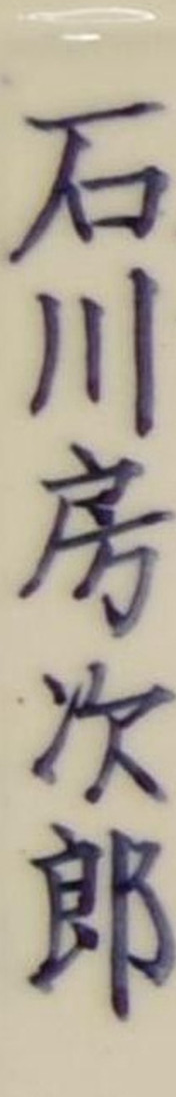石川房次郎

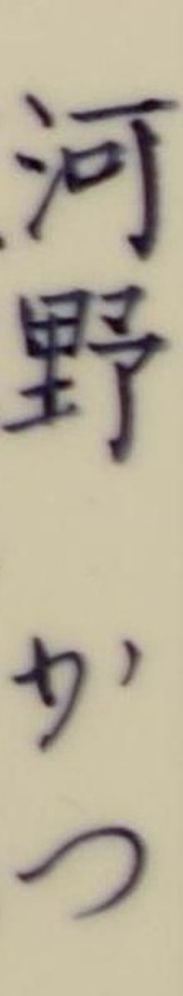河野かつ
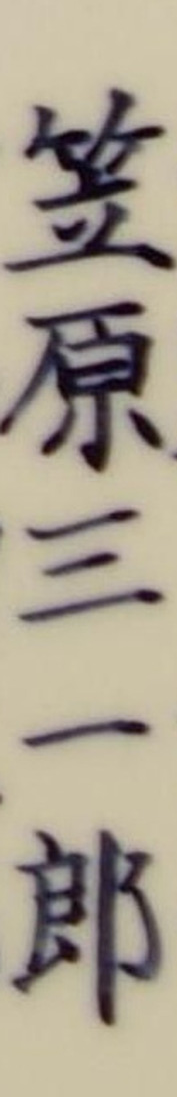笠原三一郎
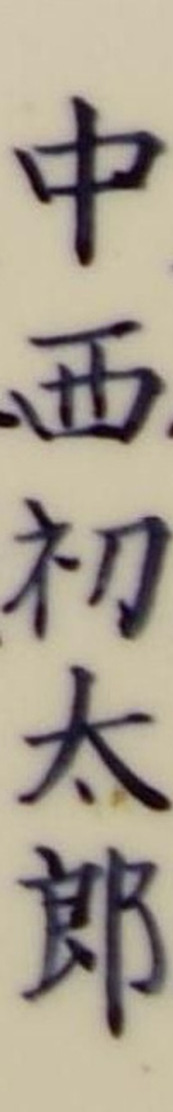中西初太郎
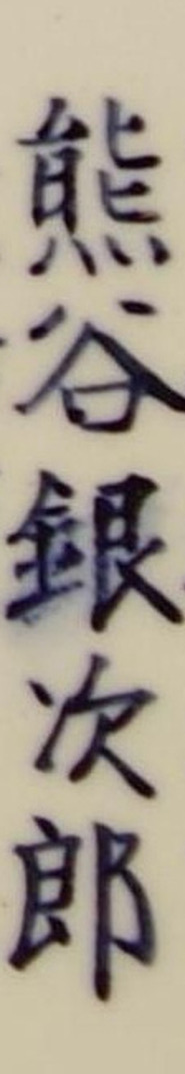熊谷銀次郎
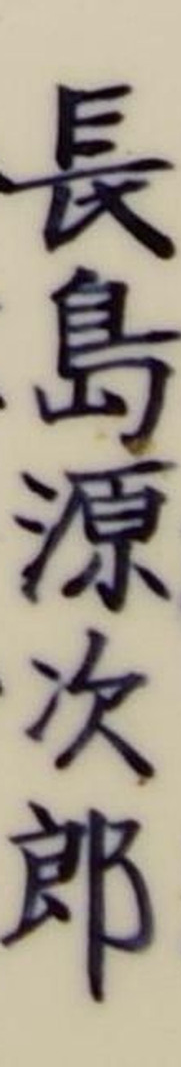長島源次郎
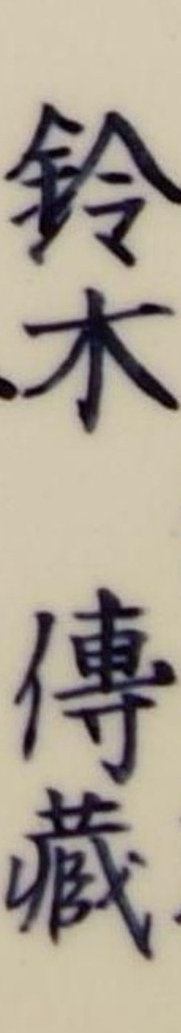鈴木傳蔵
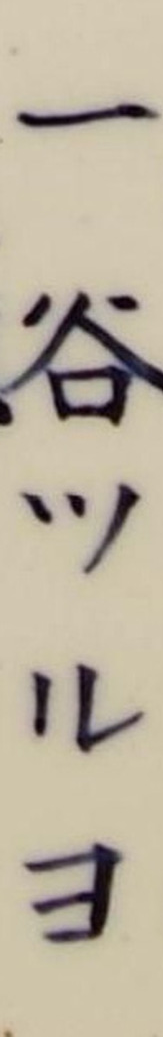一谷ツルヨ
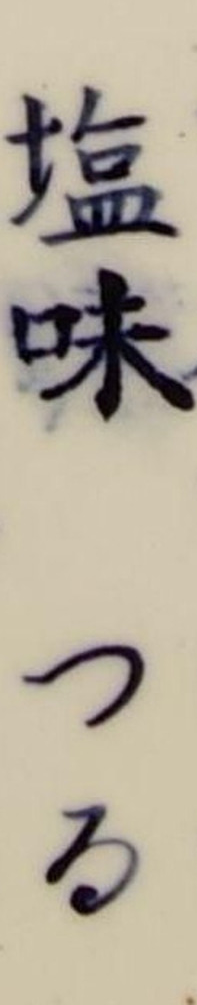塩味つる
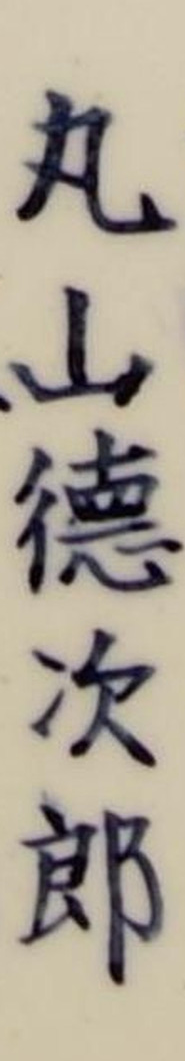丸山徳次郎
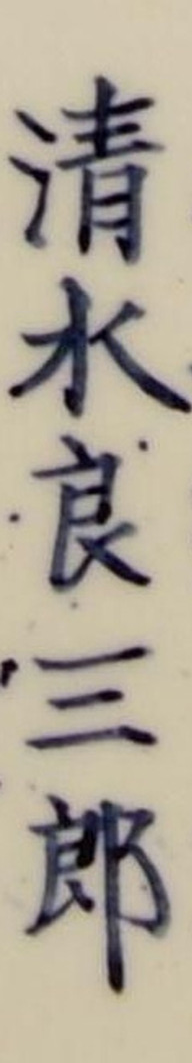清水良三郎
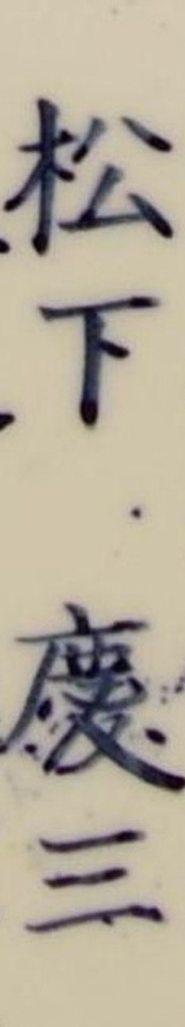松下慶三
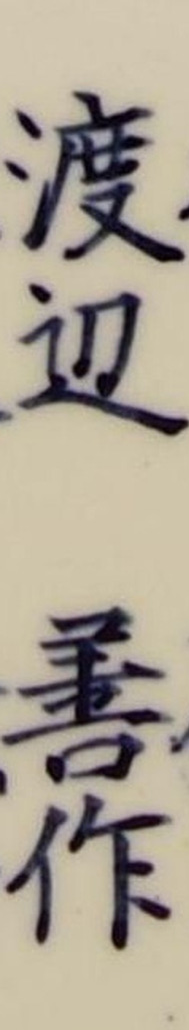渡辺善作
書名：A~D
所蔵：koyasan kongobuji
